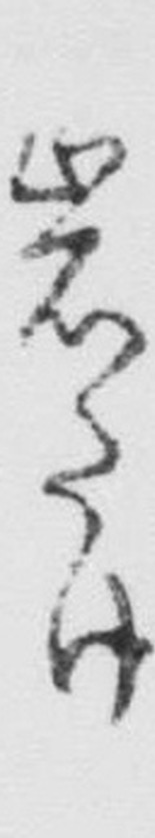岩たけ
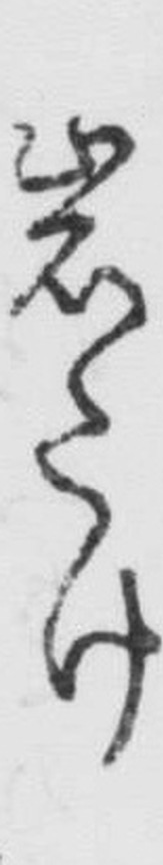岩たけ
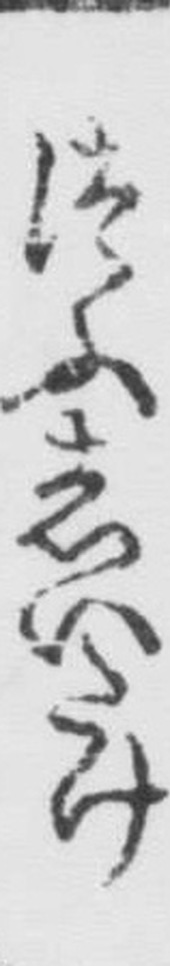つふしいたけ
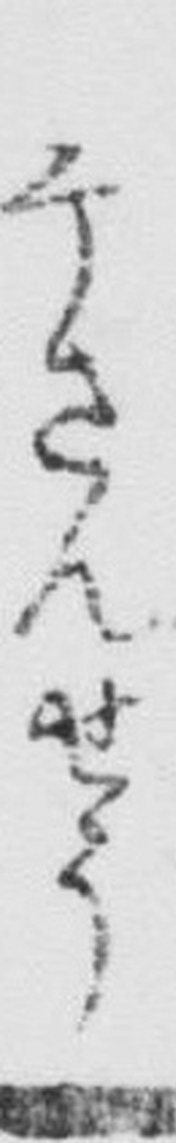干さんせう
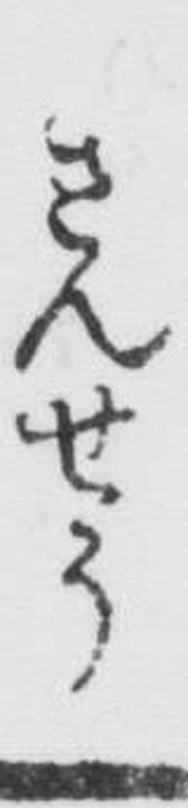さんせう
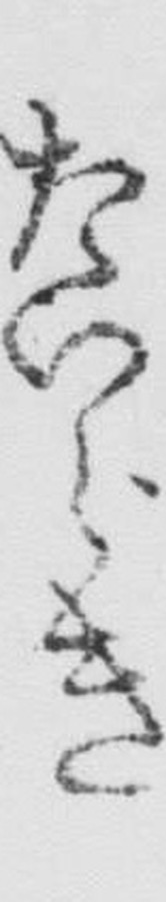たいらき
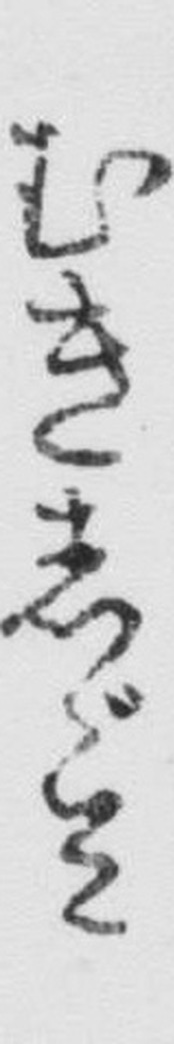むきしゞみ
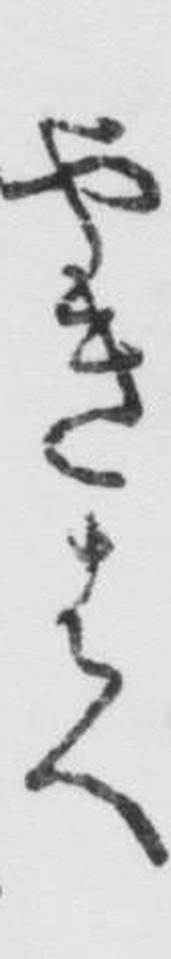やきはへ
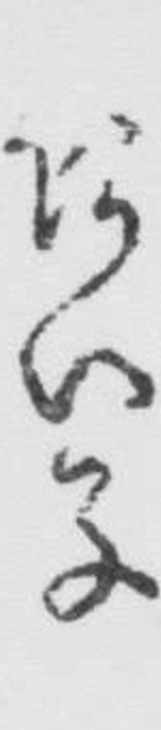あい子
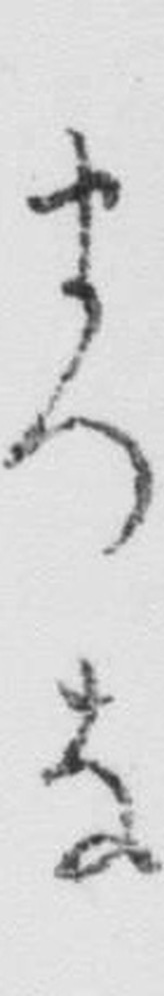まつな
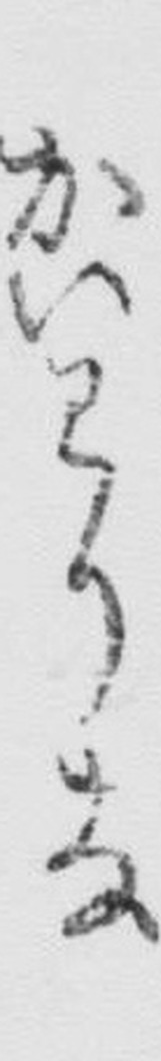かいわりな
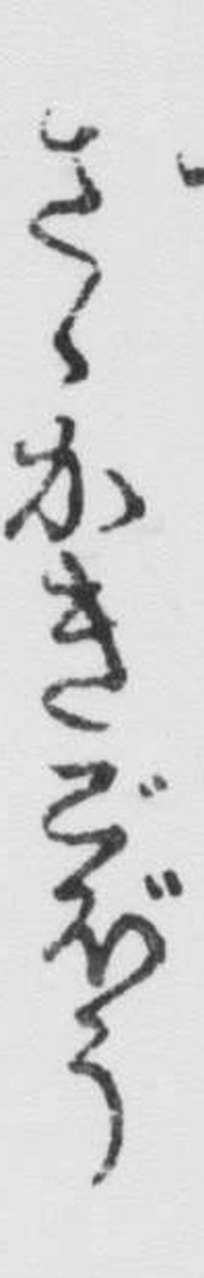さゝかきごぼう
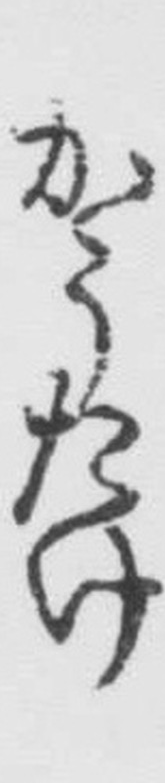かうたけ
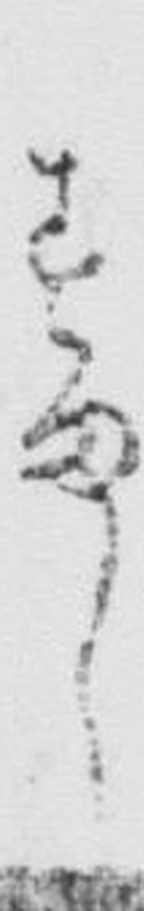すまし
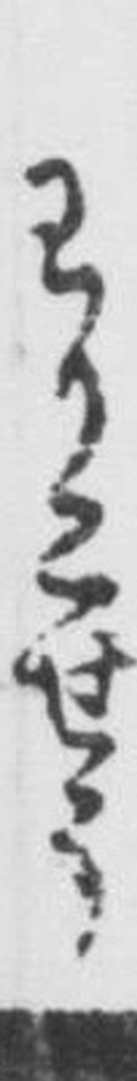わりこせう
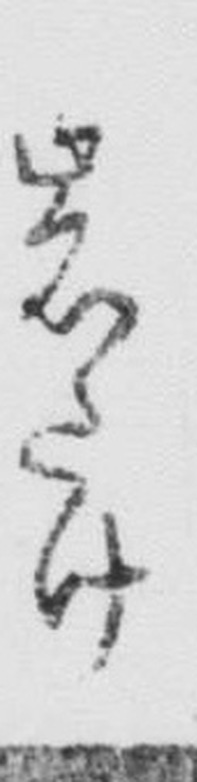岩たけ
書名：諸家通用/即席料理
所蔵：大阪府立大学学術情報センター 国文学研究資料館
